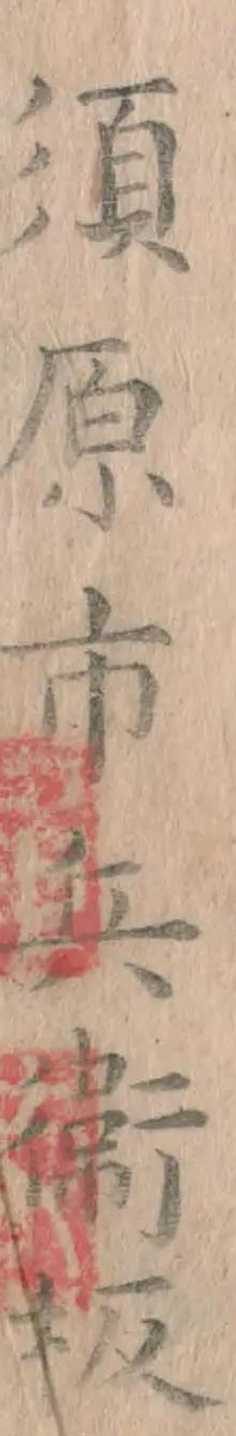須原市兵衛板
